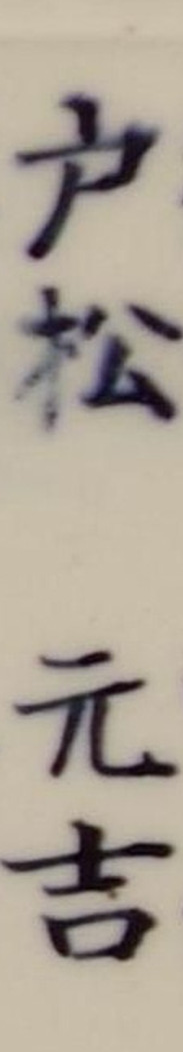戸松元吉
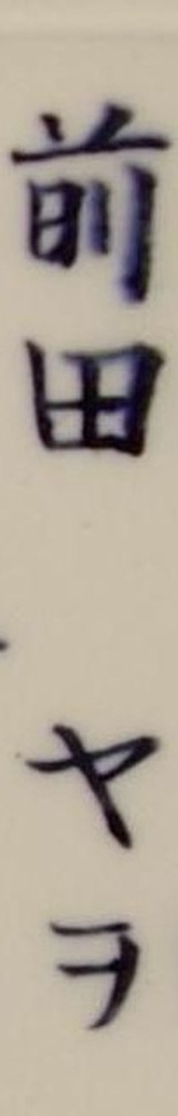前田ヤヲ
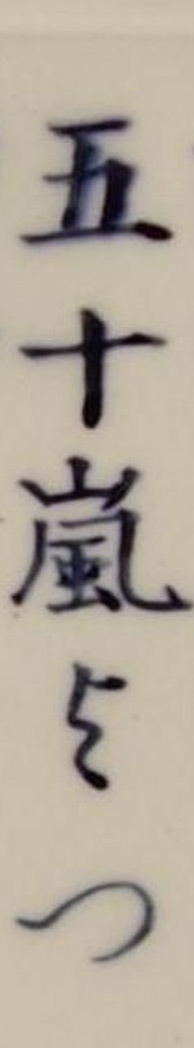五十嵐よつ
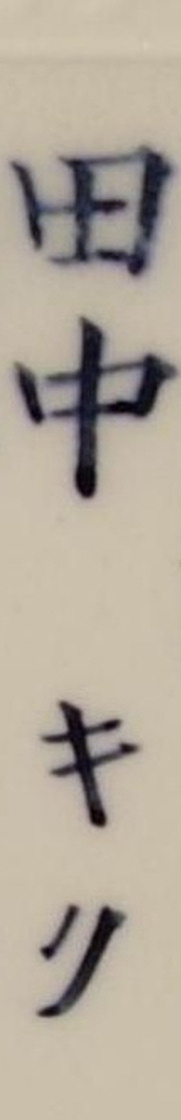田中キク
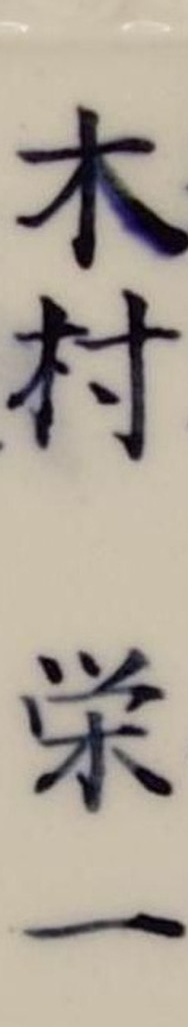木村栄一
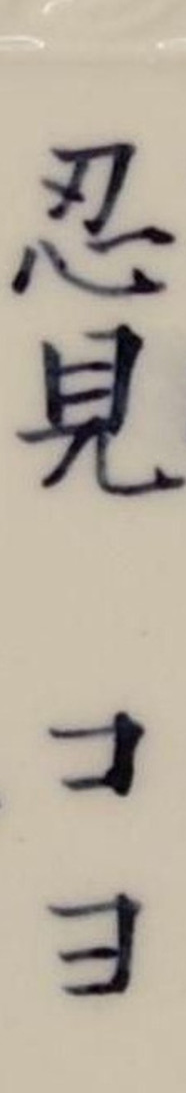忍見コヨ
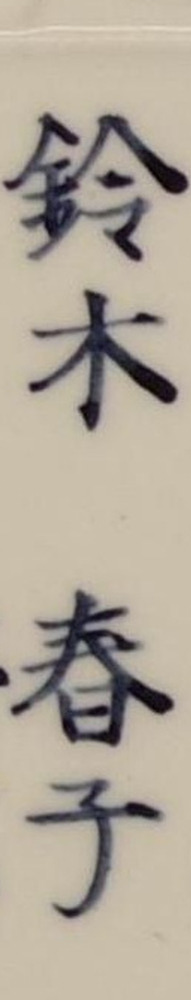鈴木春子
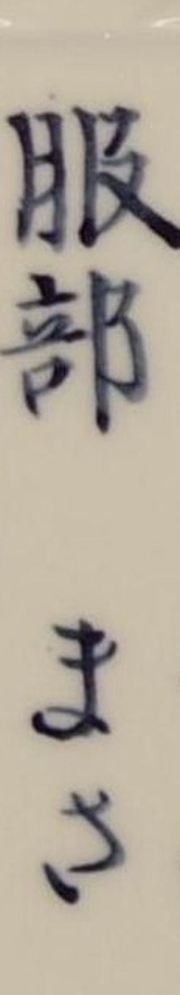服部まさ
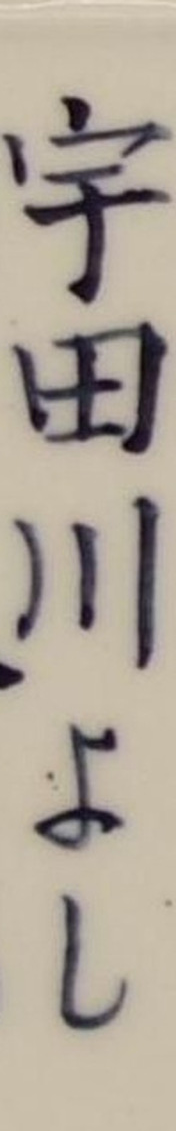宇田川よし
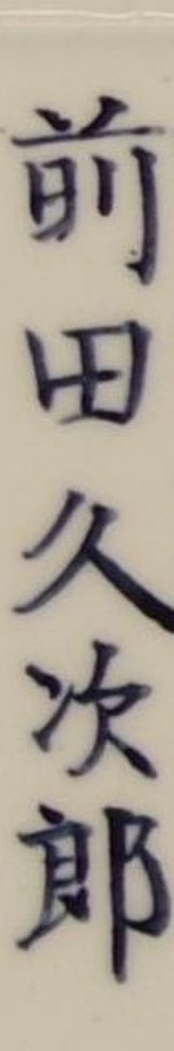前田久次郎

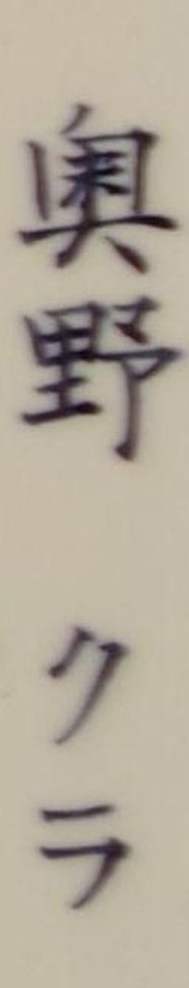奥野クラ
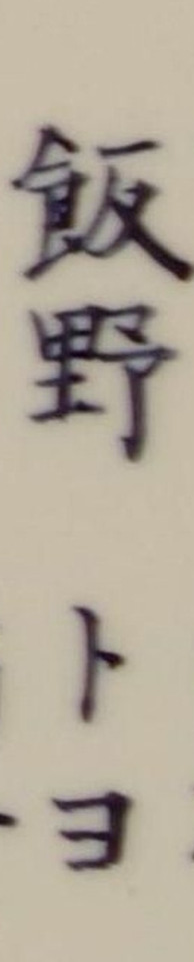飯野トヨ
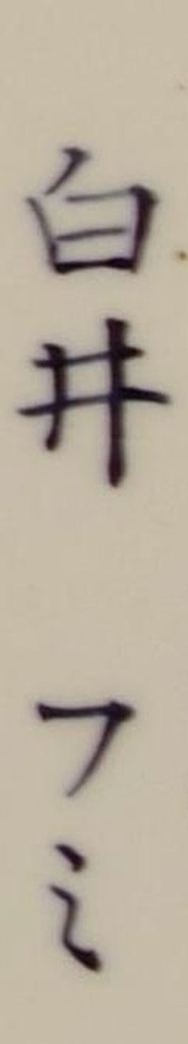白井フミ
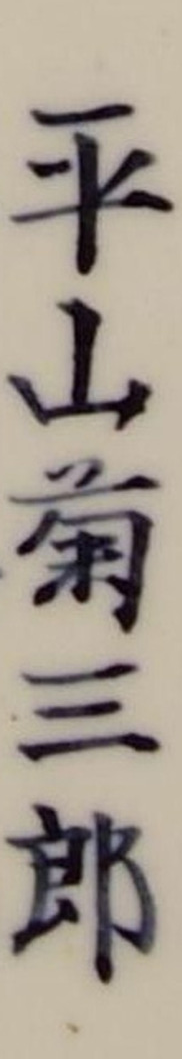平山菊三郎
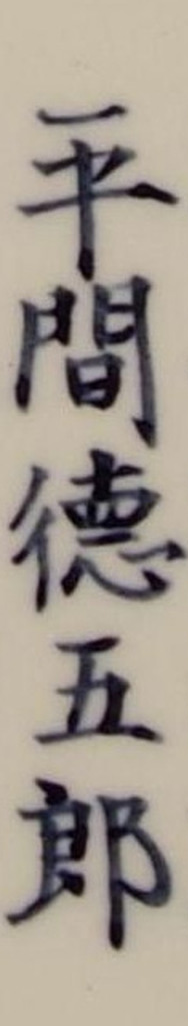平間徳五郎
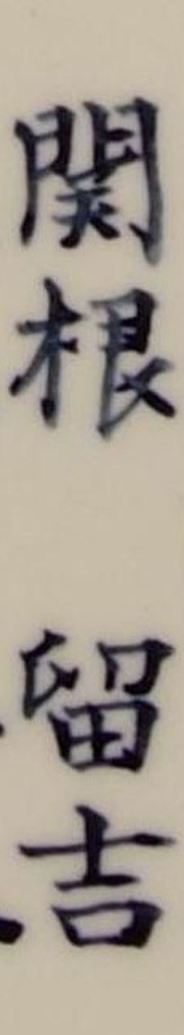関根留吉
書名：E~L
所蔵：高野山金剛峯寺
